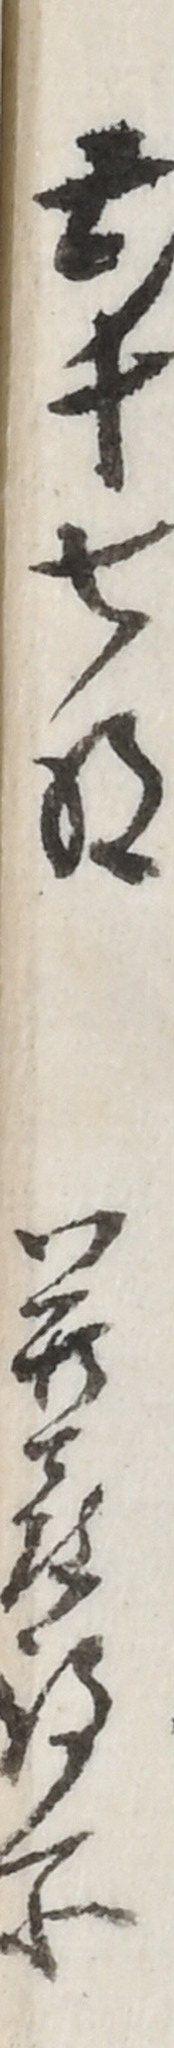一五十七枚開産役所
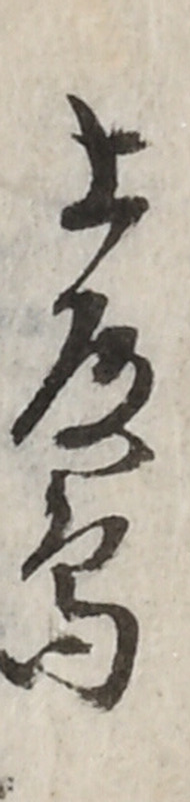上大島
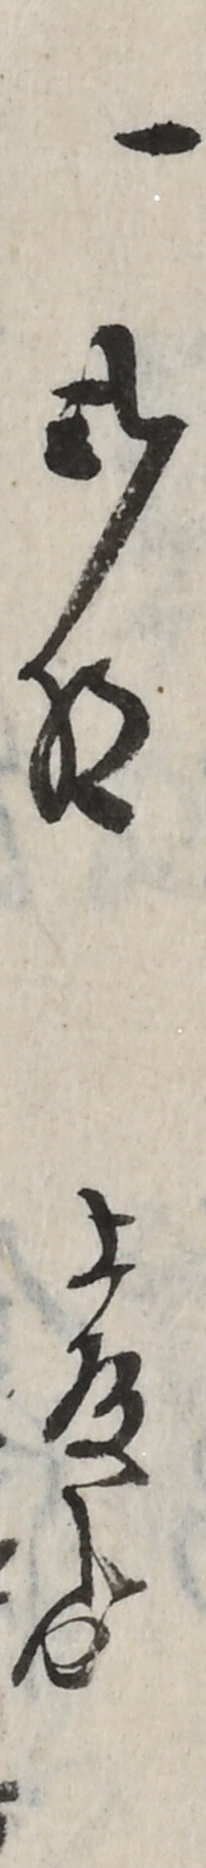一弐枚覚作

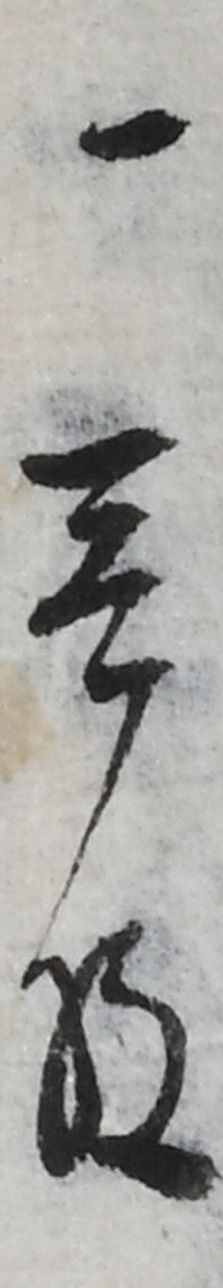一四枚
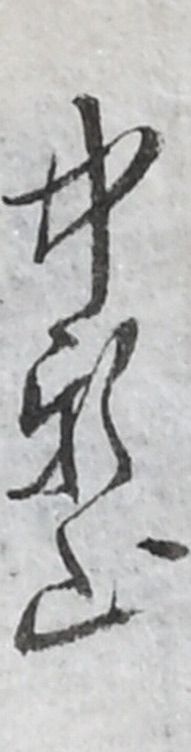下新山
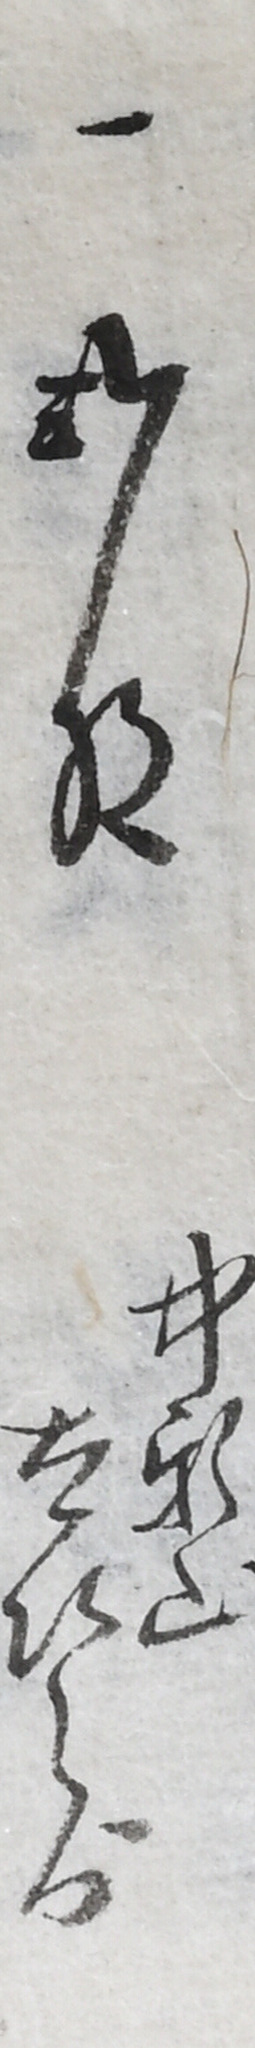一七枚久次郎
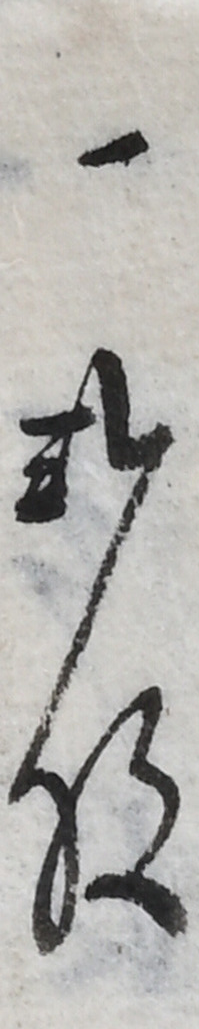一四枚
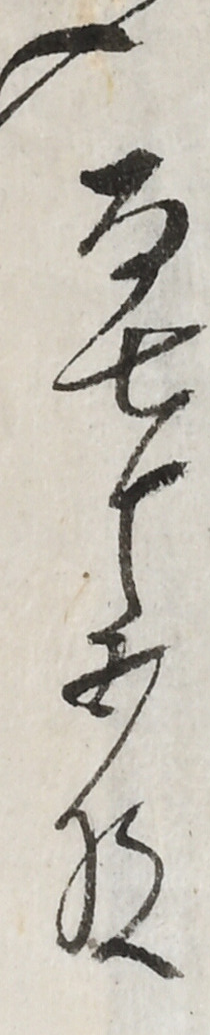〆百七十五枚
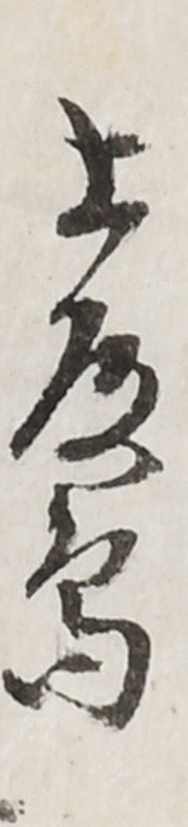上殿鳥
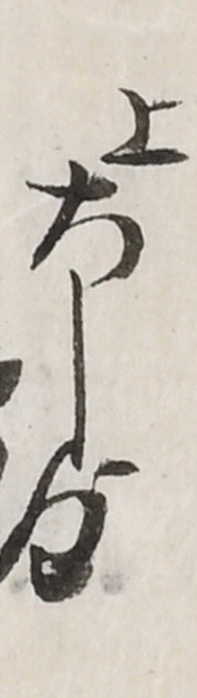上大しま
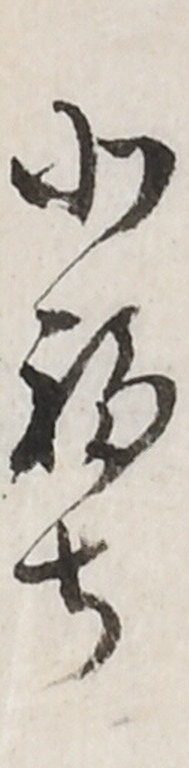北福ち
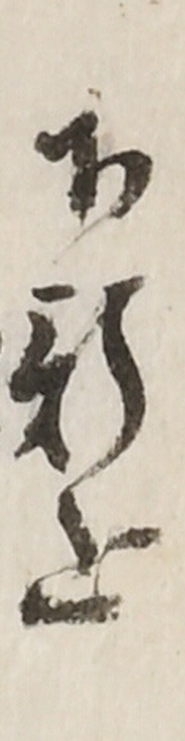下新山

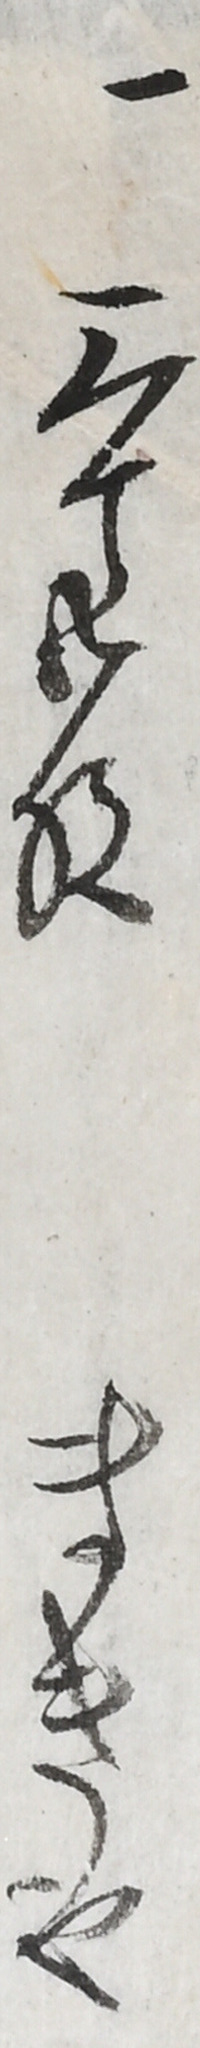一三十弐枚まきや
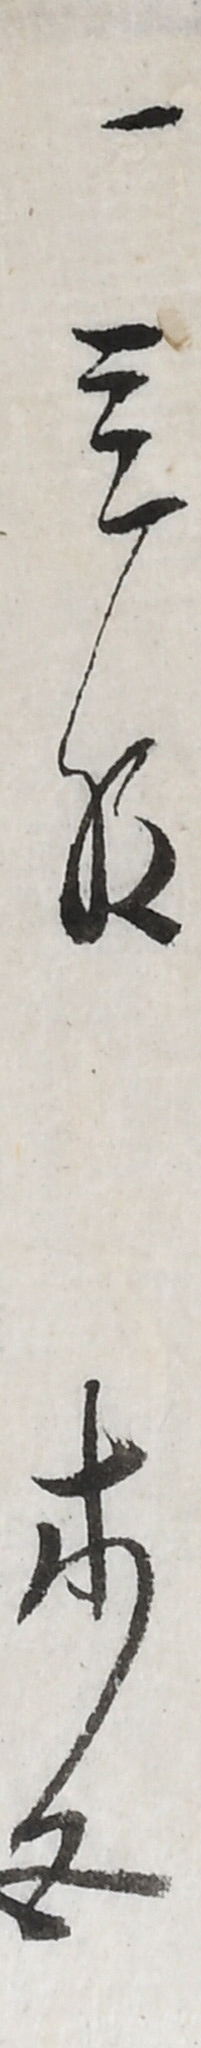一三枚ホ五
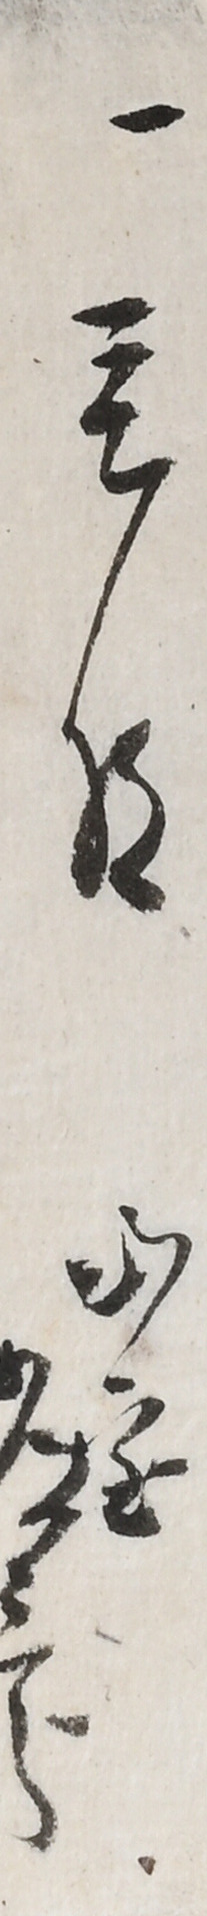一壱枚常三郎
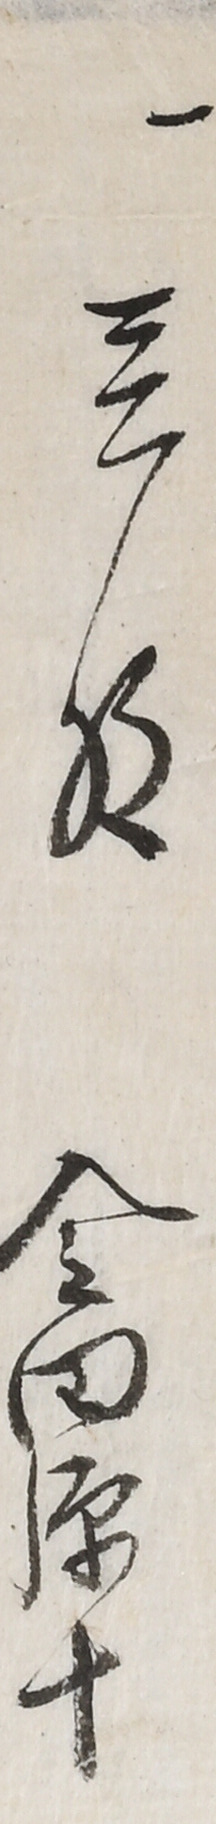一壱枚金田源十
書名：髙遠限楮幣引換覚帳
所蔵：伊那市立高遠町図書館・合同会社AMANE
